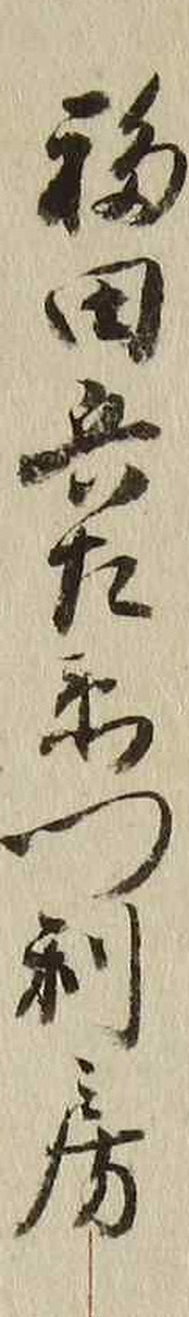福田兵左衛門利房
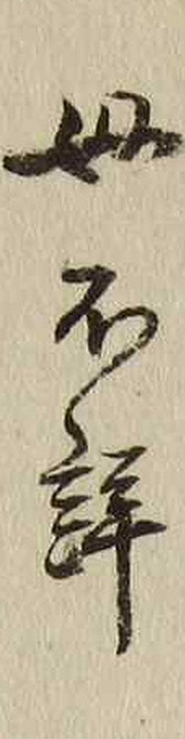母不詳
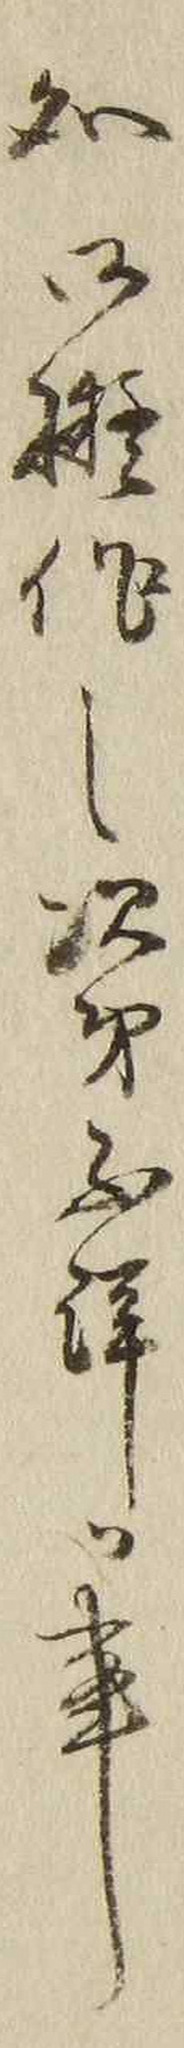処御擬作之次第不詳候事

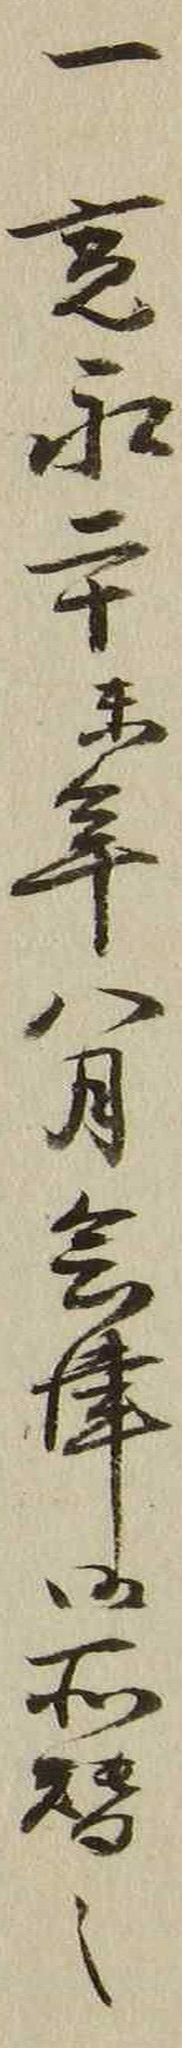一寛永二十未年八月会津御所替之
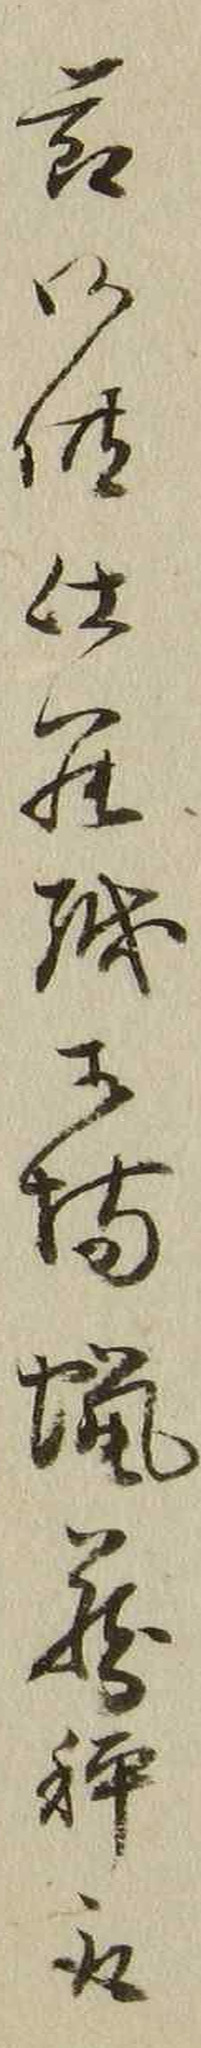節御供仕罷越相持蝋蔵秤取
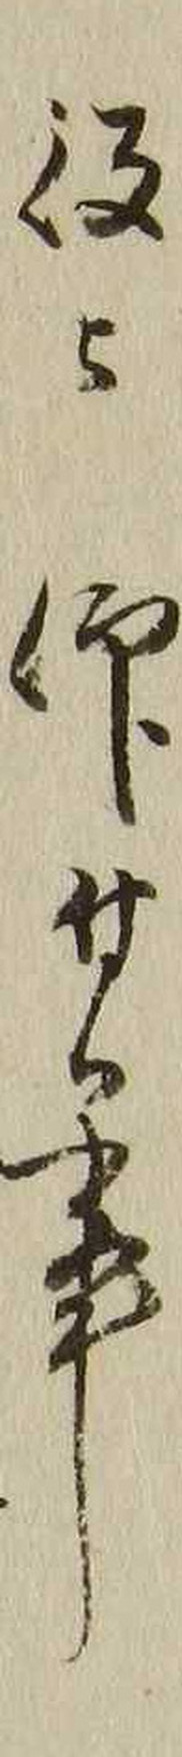役被仰付候事
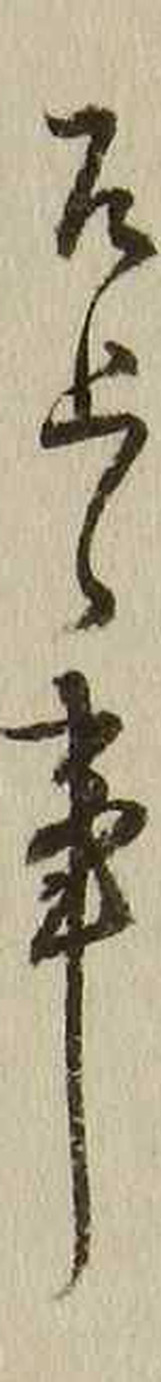召上候事
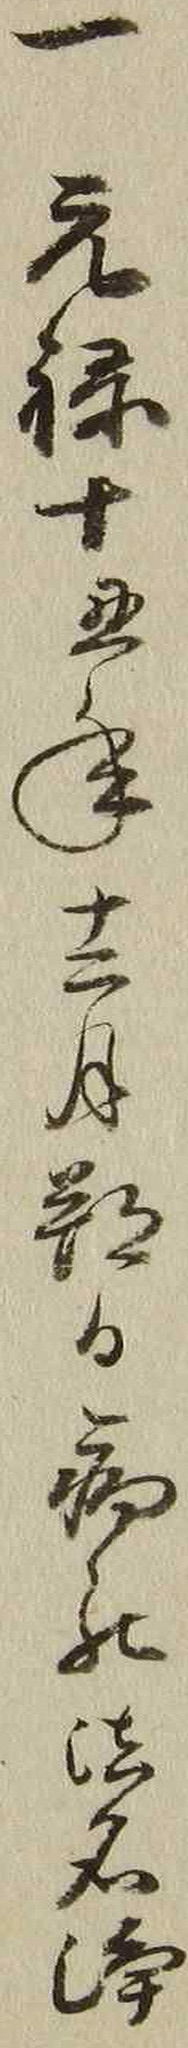一元禄十丑年十二月朔日病死法名浄
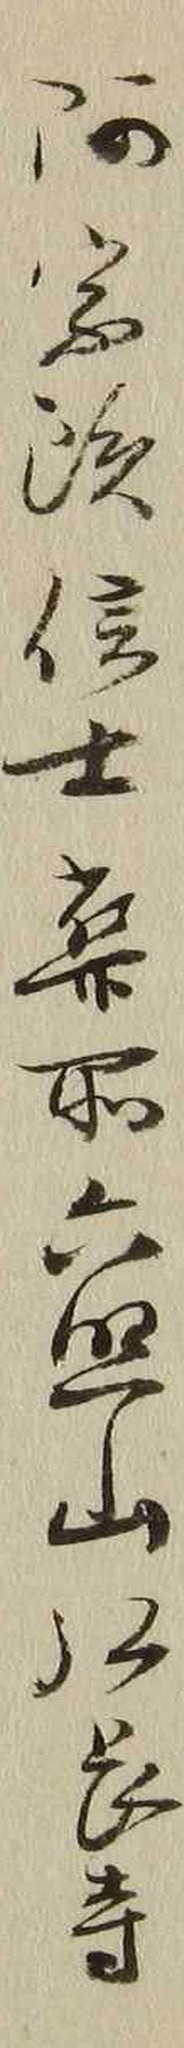阿富頭信士葬所六照山弘長寺
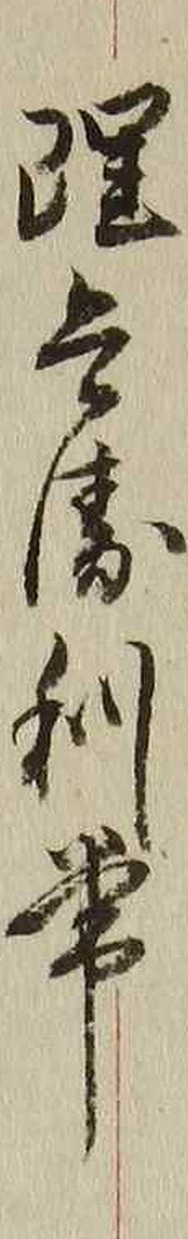理兵衛利常
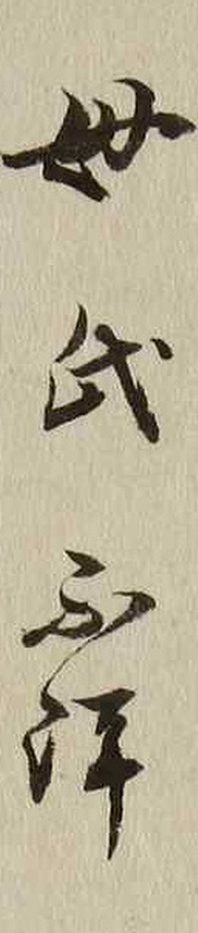母氏不詳
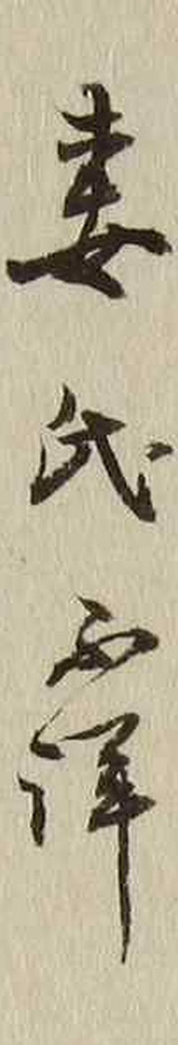妻氏不詳
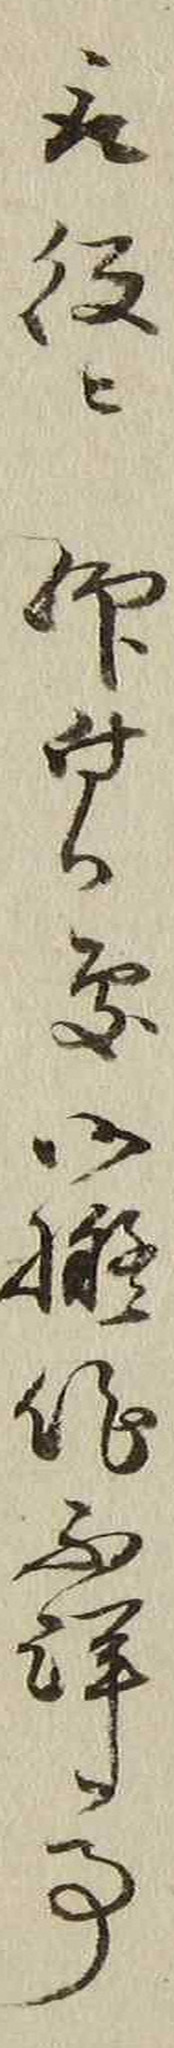取役被仰付候処御擬作不詳候事
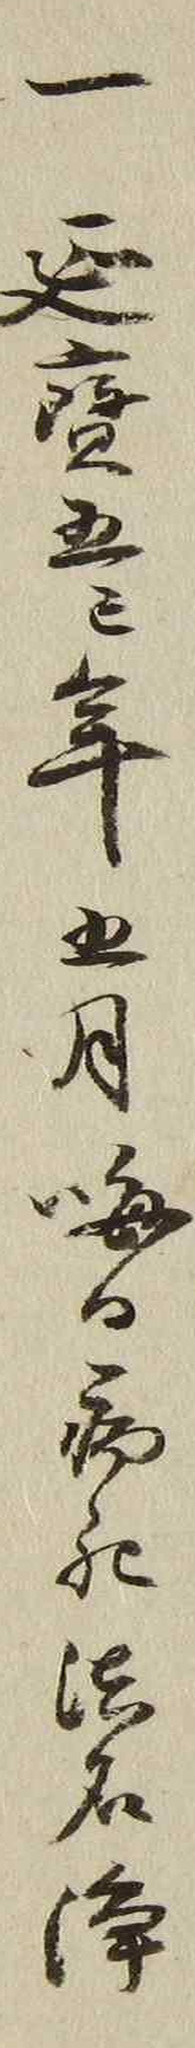一延宝五巳年五月晦日病死法名浄
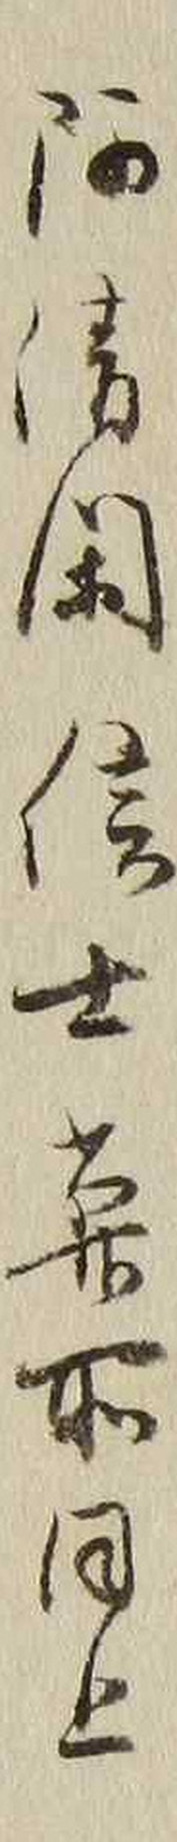阿清閑信士葬所同上
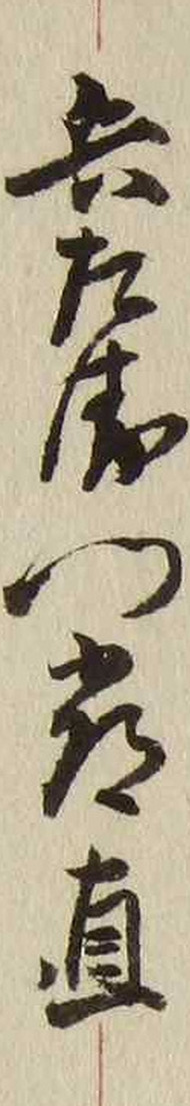兵左衛門常直
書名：諸士系譜　巻之236　ふ之部4
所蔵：会津若松市立会津図書館
